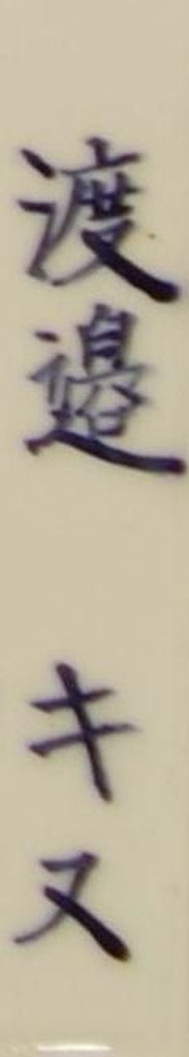渡辺キヌ
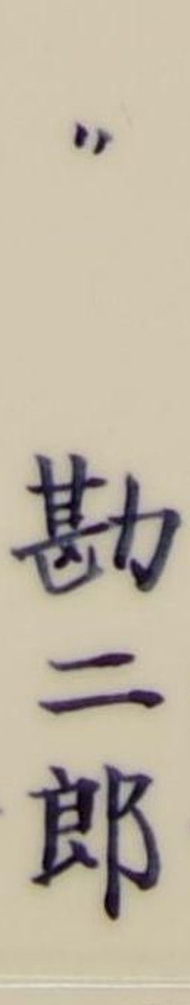勘二郎
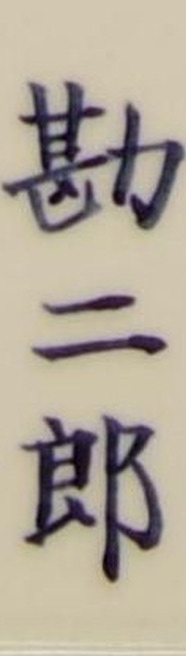勘二郎
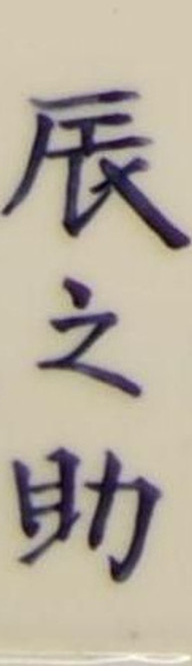辰之助
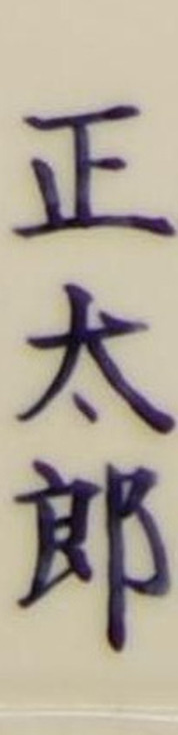正太郎

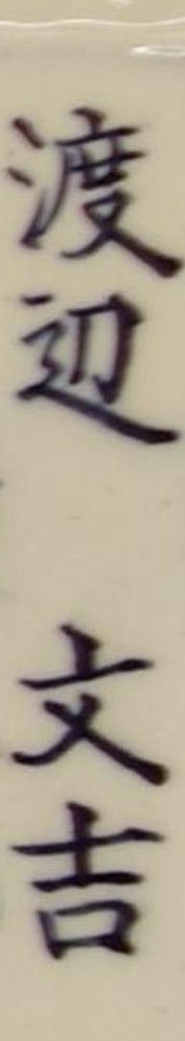渡辺文吉
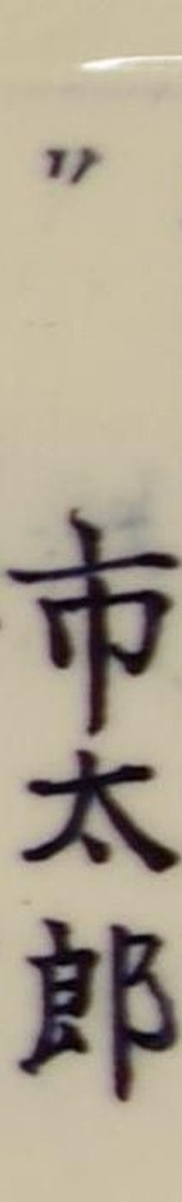市太郎
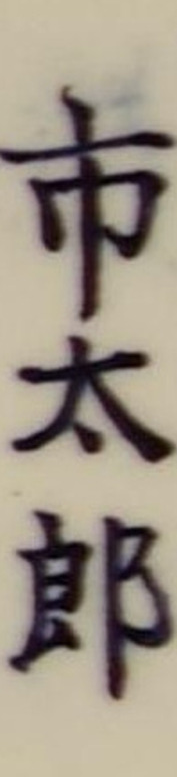市太郎
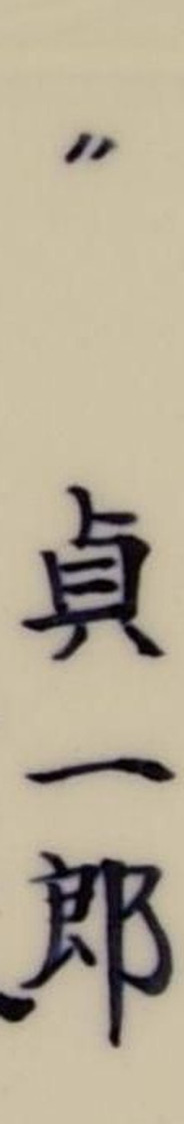貞一郎
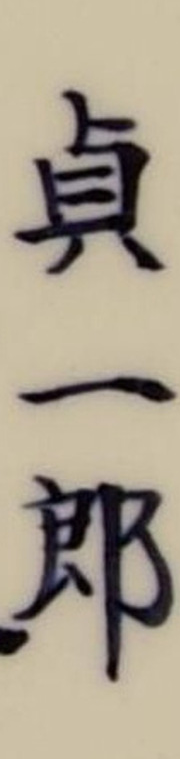貞一郎
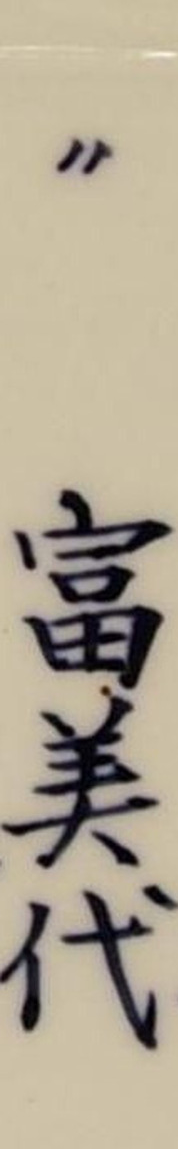富美代
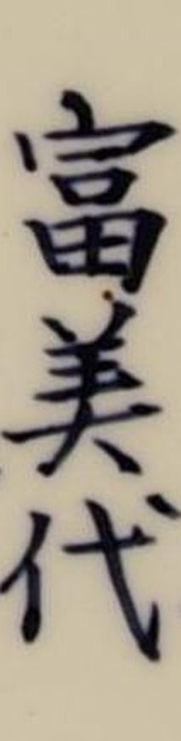富美代
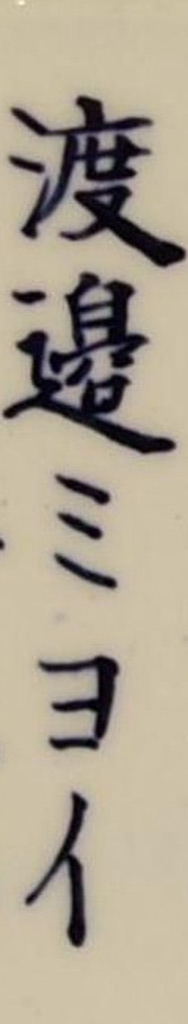渡辺ミヨイ
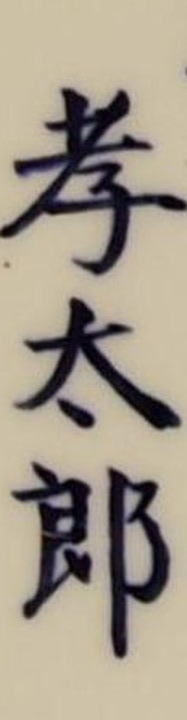孝太郎
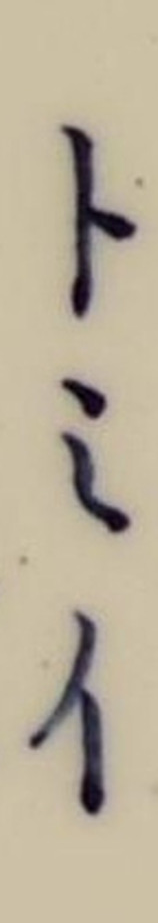トミイ

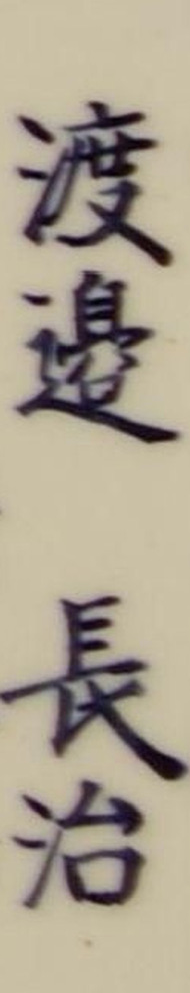渡邉長治
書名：A~D
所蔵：koyasan kongobuji
